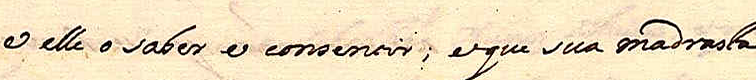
e elle o saber e consentir; e que sua madrasta
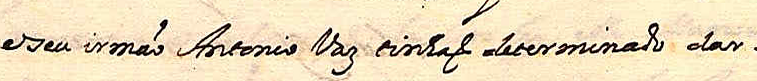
e seu irmaõ Antonio Vaz tinhaõ determinado dar
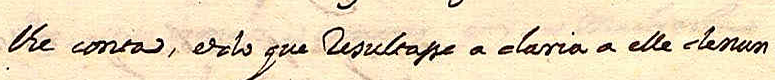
lhe conta, e do que Resultasse a daria a elle denun
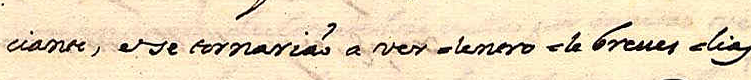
ciante, e se tornariaõ a ver dentro de breues dias.
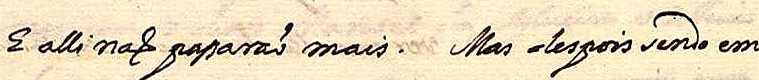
E alli naõ passaraõ mais. Mas despois sendo em
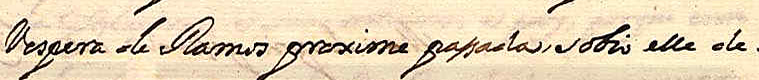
Vespera de Ramos proxime passada sobio elle de
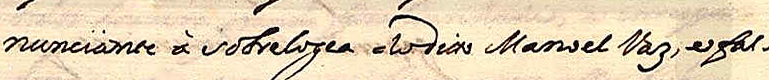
nunciante à sobrelogea do ditto Manoel Vaz, e fal
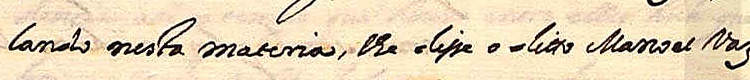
lando nesta materia, lhe disse o ditto Manoel Vaz
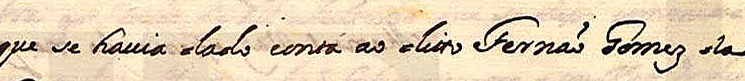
que se hauia dado conta ao ditto Fernaõ Gomez da
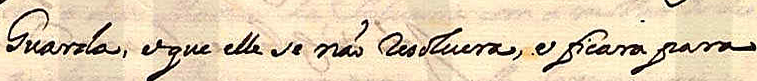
Guarda, e que elle se naõ Resoluera, e ficara para
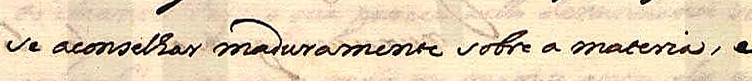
se aconselhar maduramente sobre a materia, e
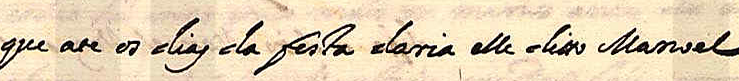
que ate os dias da festa daria elle ditto Manoel
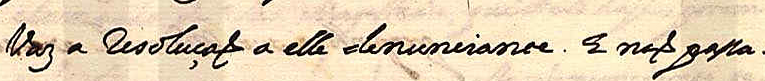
Vaz a Resolução a elle denunciante. E naõ passa
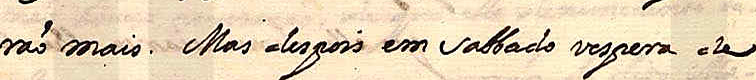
raõ mais. Mas despois em sabbado vespera de
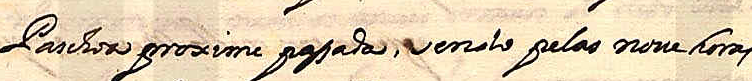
Paschoa proxime passada, sendo pelas noue horas
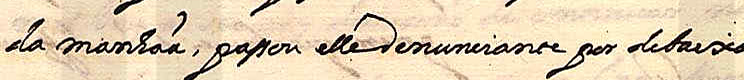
da manhaã, passou elle denunciante por debaixo
